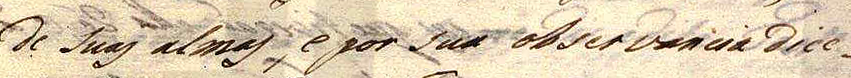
de suas almas, e por sua observancia dice
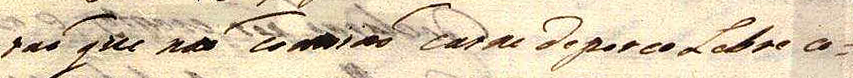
raõ que naõ comiaõ carne de porco Lebre co
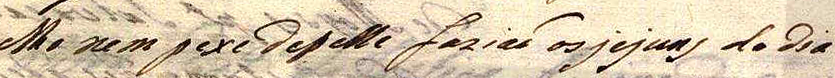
elho nem pexe de pelle faziaõ os jejuns do dia
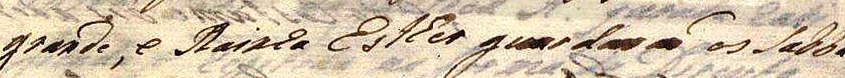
grande, e Rainha Esther guardavaõ os sabba
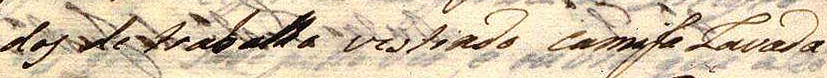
dos de trabalho vistindo camisa Lavada
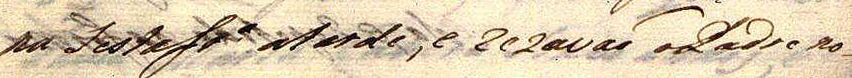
na sesta fr.a a tarde, e rezavaõ o Padre no
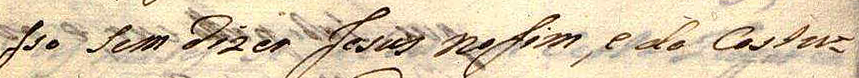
sso sem dizer Jesus no fim, e do costu
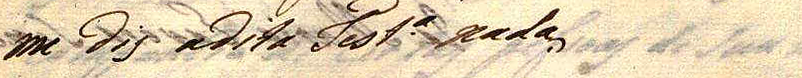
me dis a dita Test.a nada.
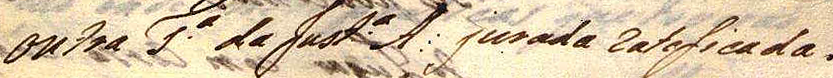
outra T.a da Just.a A. jurada rateficada.
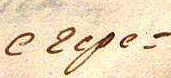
e repe
